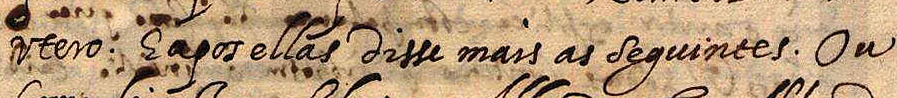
vtero. E apos ellas disse mais as seguintes. Ou
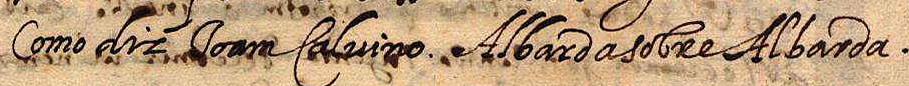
Como diz Ioam Caluino. Albarda sobre Albarda.
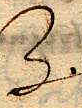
3.
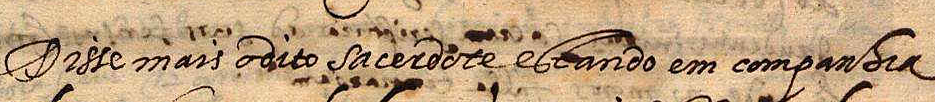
Disse mais o dito sacerdote estando em companhia
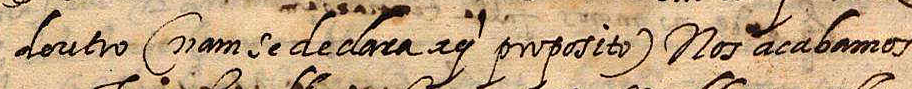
doutro (nam se declara a q̄ proposito) Nos acabamos
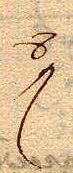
8
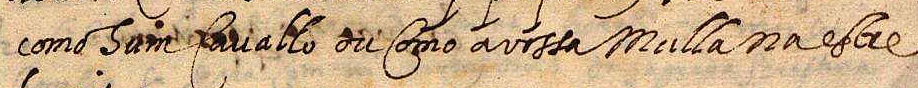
como hum Cauallo ou Como a vossa Mulla na estre
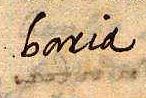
baria
